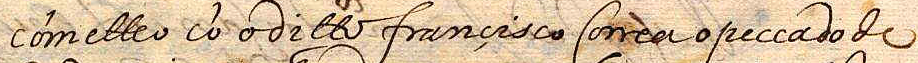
com̄etteo cō o ditto françisco Correa o peccado de
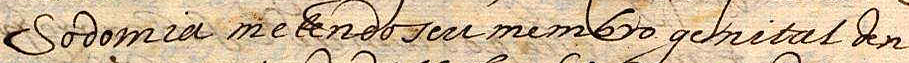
Sodomia metendo seu membro genital den
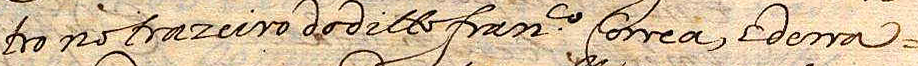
tro no trazeiro do ditto franco. Correa, E derra
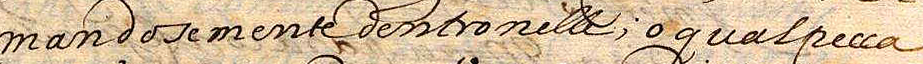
mando semente dentro nelle; o qual pecca
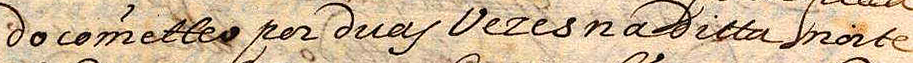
do com̄etteo por duas Vezes na ditta noite
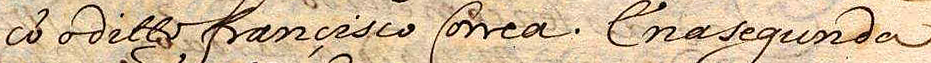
cō o ditto françisco Correa. E na segunda
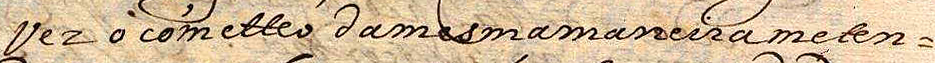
Vez o com̄etteo da mesma maneira meten
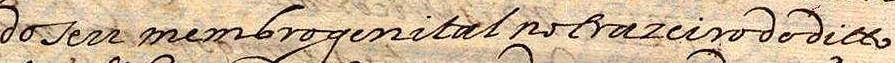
do seu membro genital no trazeiro do ditto
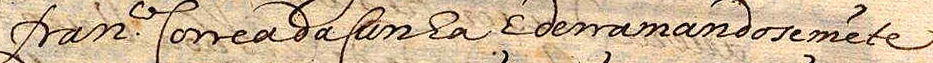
franco. Correa da Cunha E derramando semēte
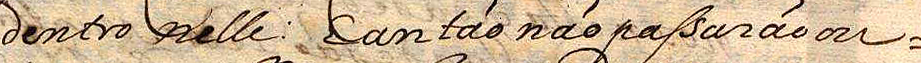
dentro nelle: E antaõ naõ passaraõ ou
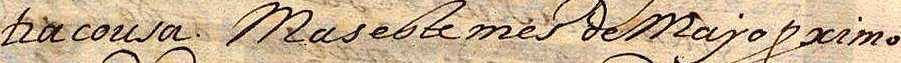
tra cousa. Mas este mes de Mayo ꝓximo
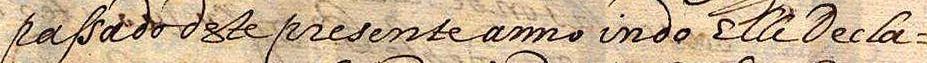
passado deste presente anno indo Elle Decla
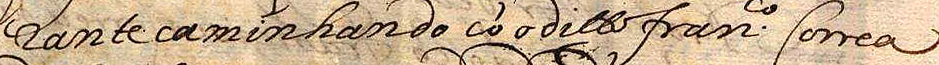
rante caminhando cō o ditto franco. Correa
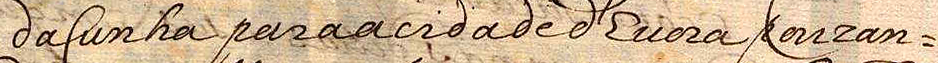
da Cunha para a çidade d'Euora pouzan
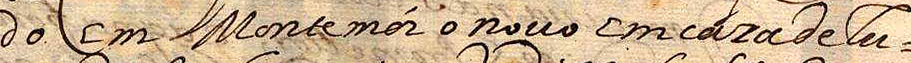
do Em Montemór o nouo Em caza de Lu
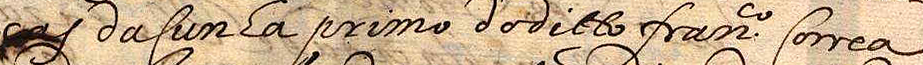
cas da Cunha primo do ditto franco. Correa
